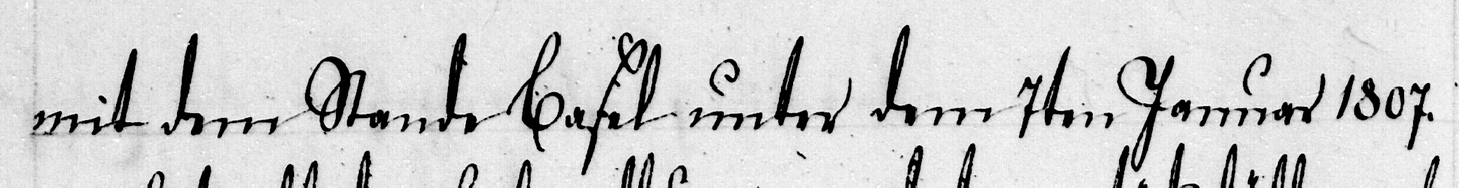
mit dem Stande Basel unter dem 7ten Januar 1807.
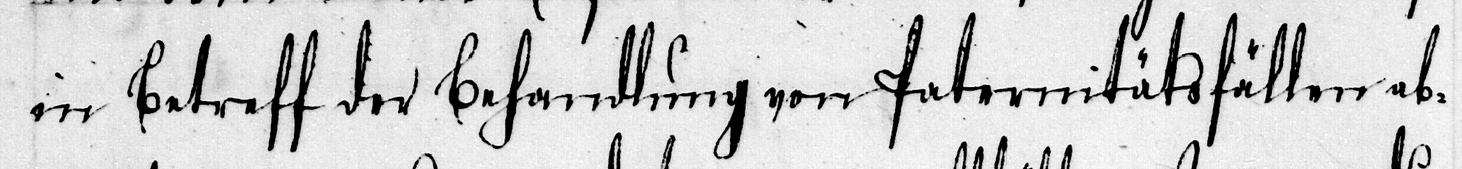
in Betreff der Behandlung von Paternitätsfällen a¬
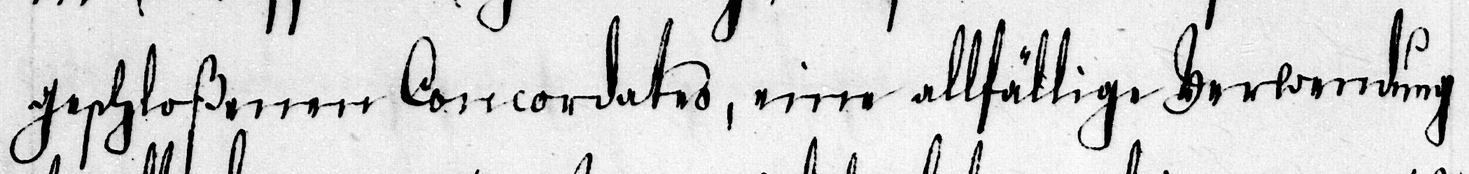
bgeschloßenen Concordates, eine allfällige Verwendung
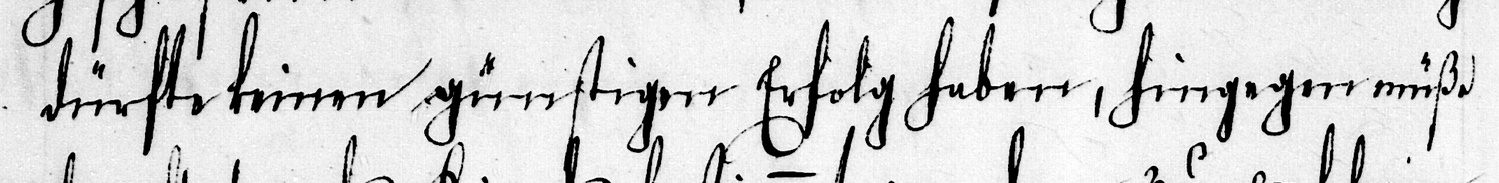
dürfte keinen günstigen Erfolg haben, hingegen müße
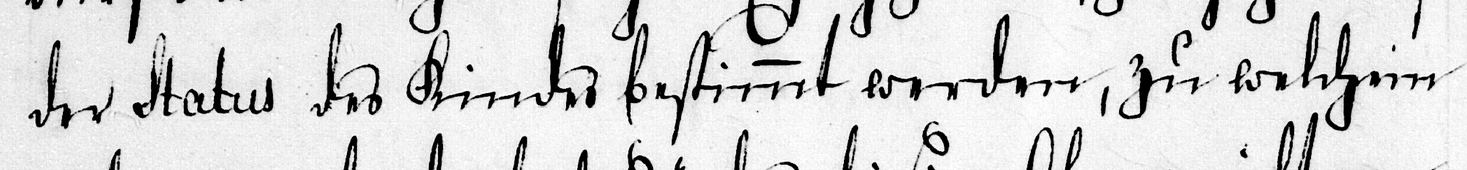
der Status des Kindes bestimmt werden, zu welchem
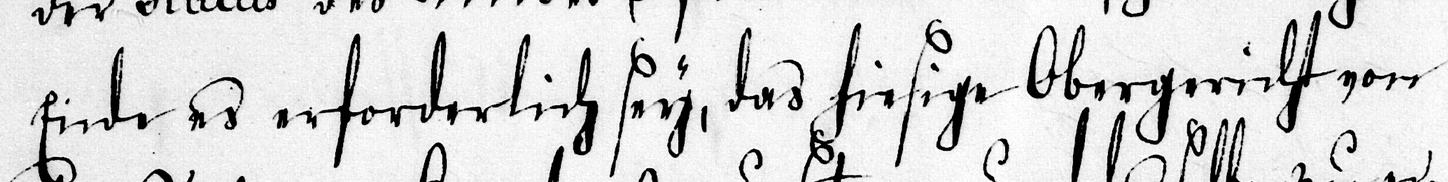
Ende es erforderlich sey, das hiesige Obergericht von
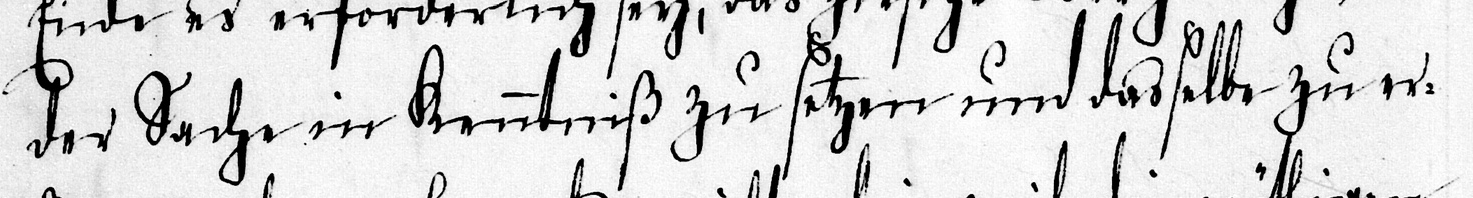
der Sache in Kenntniß zu setzen und dasselbe zu er¬
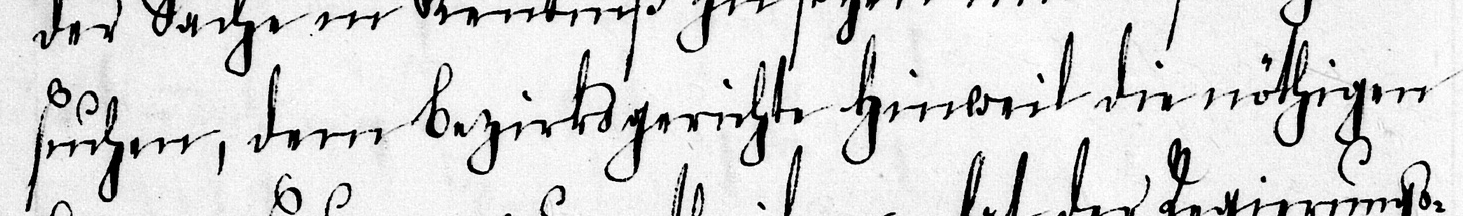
suchen, dem Bezirksgerichte Hinweil die nöthigen
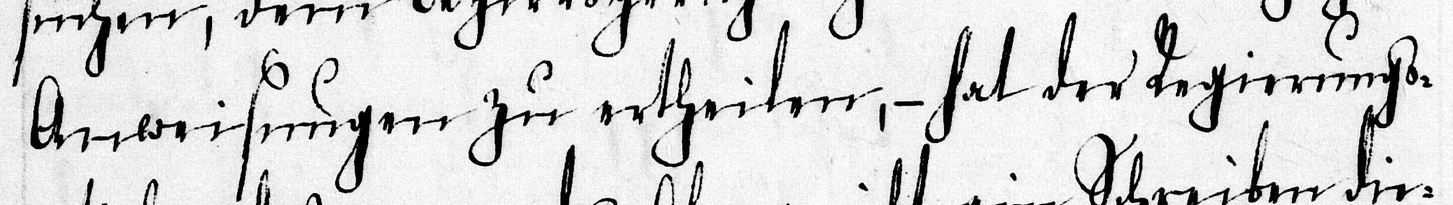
Anweisungen zu ertheilen, – hat der Regierungs¬
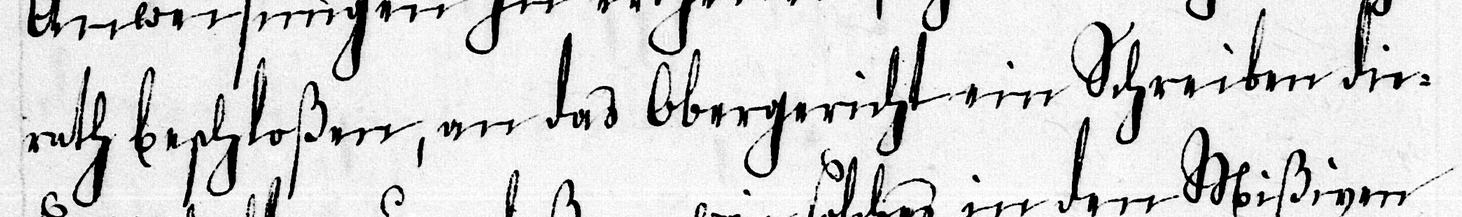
rath beschloßen, an das Obergericht ein Schreiben die¬
